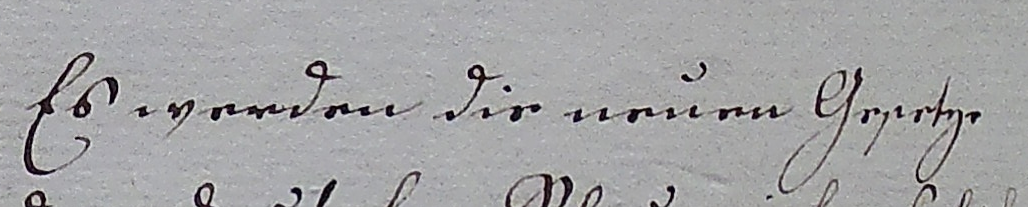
Es werden die neuen Gesetze
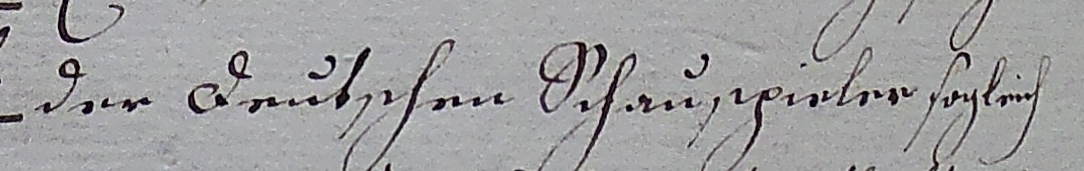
der Deutschen Schauspieler sogleich
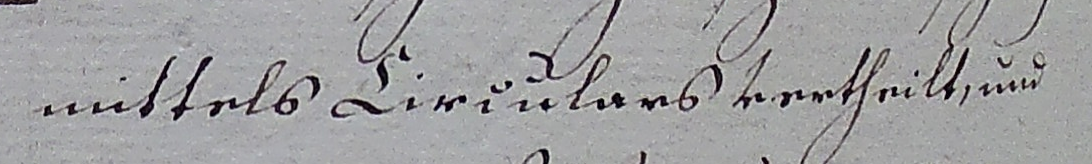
mittels Circulars vertheilt und
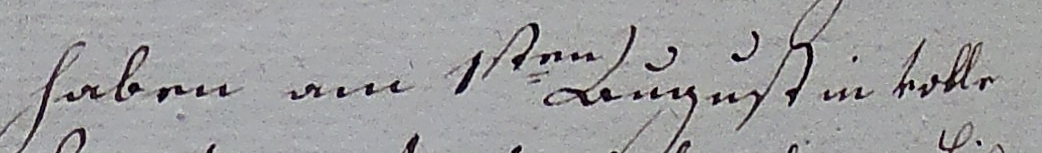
haben am 1ste͇n August in volle
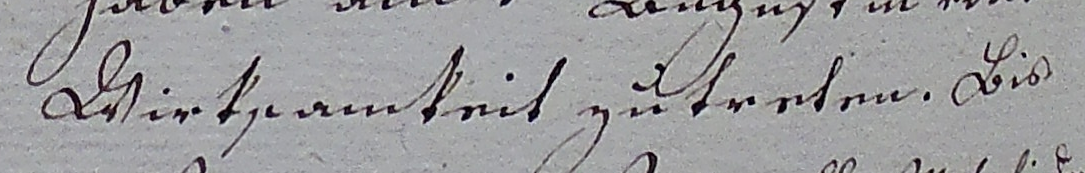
Wirksamkeit zutreten. Bis
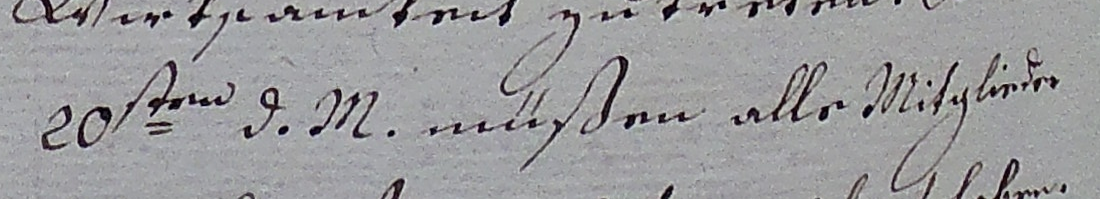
20ste͇n d.M. müßen alle Mitglieder
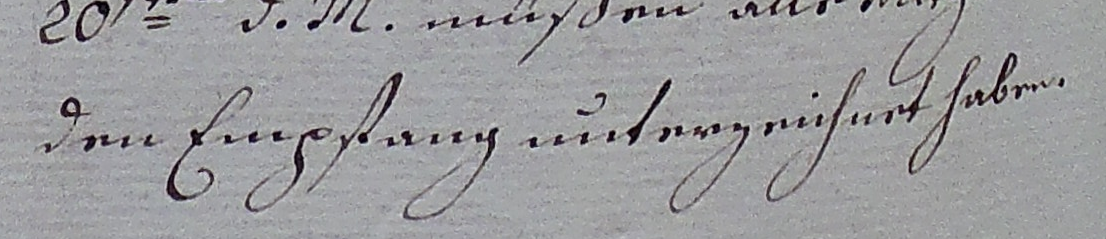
den Empfang unterzeichnet haben.
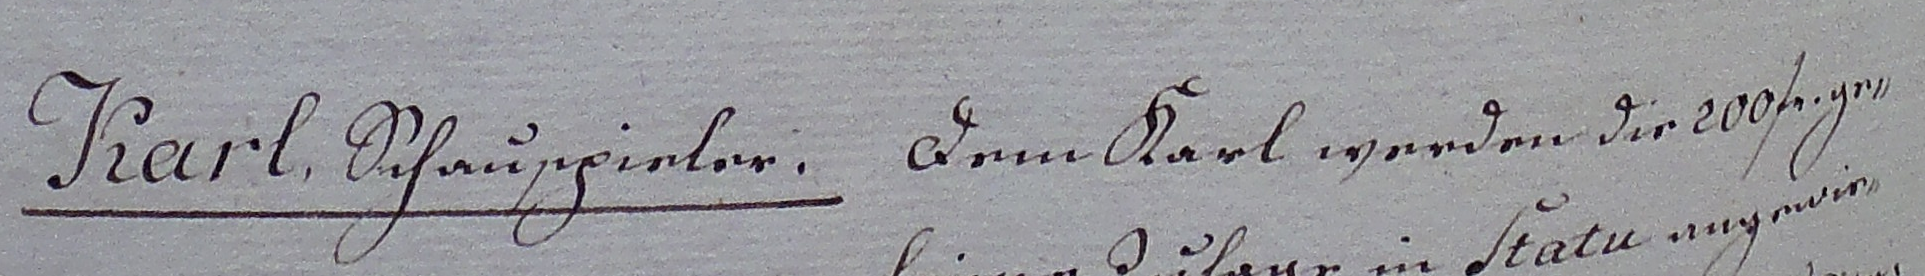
Karl, Schauspieler. Dem Karl werden die 20fr. ge¬
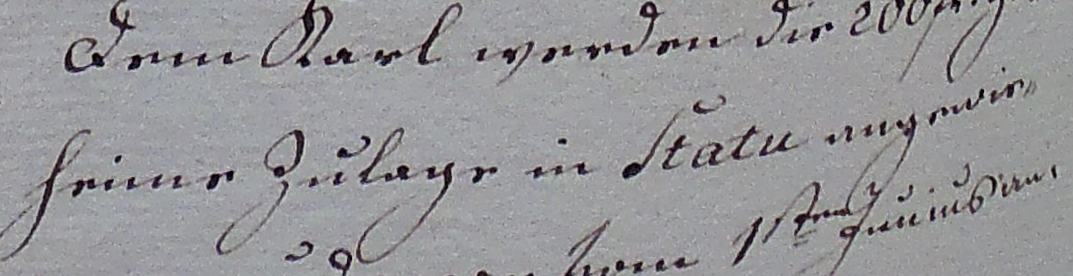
heime Zulage in Statu angewie
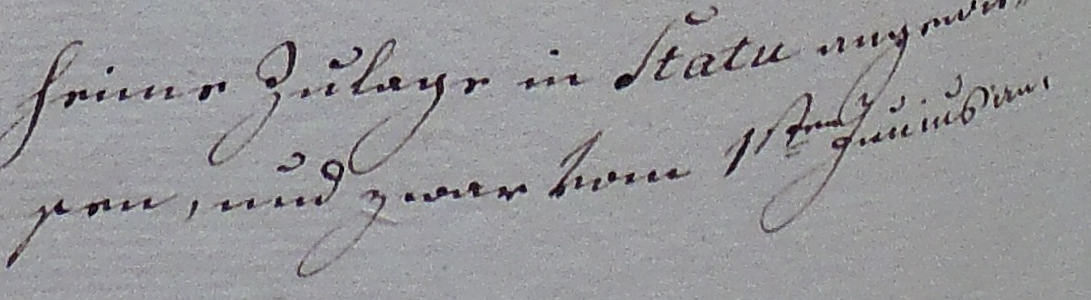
sen, und zwar vom 1ste͇n Junius an.
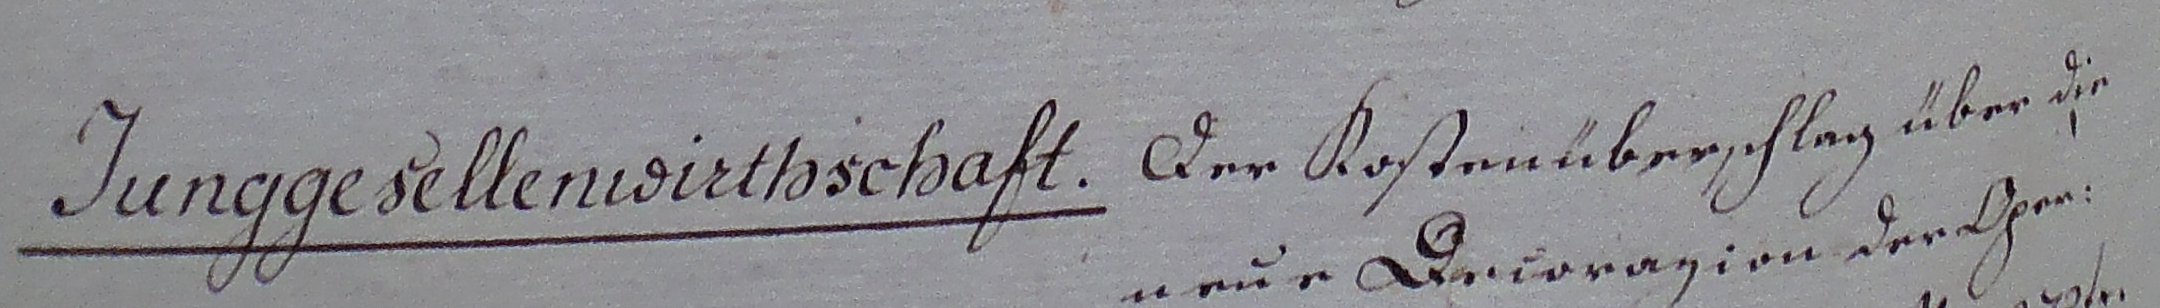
Junggesellenwirthschaft. Der Kostenüberschlag über die
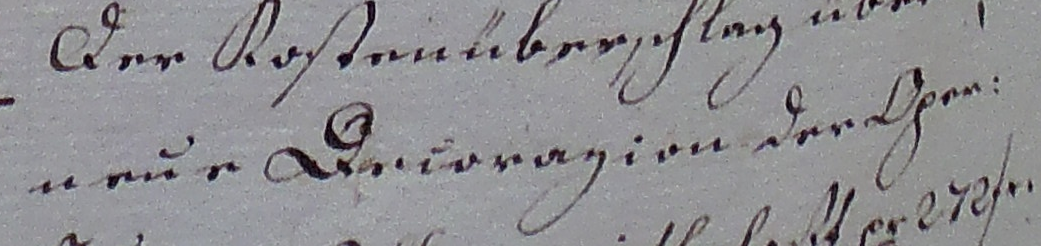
neue Decorazion der Oper:
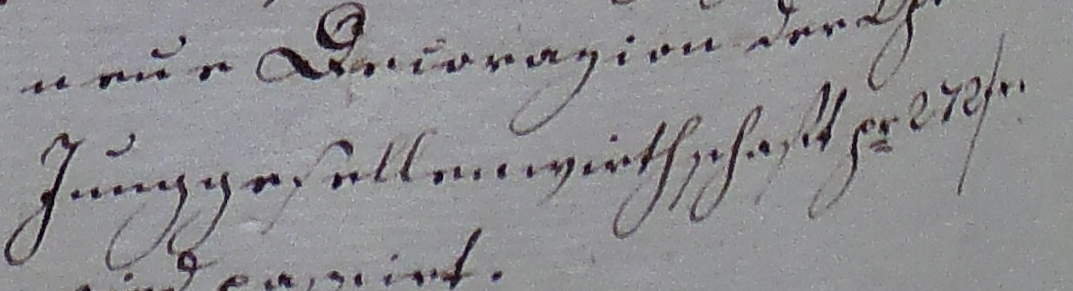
Junggesellenwirthschaft pr͇ 272fr.
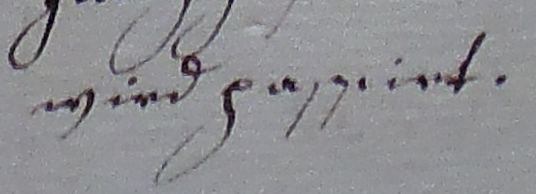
wird passirt.
